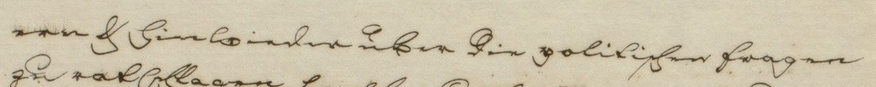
ern & hinwieder über die politischen Fragen
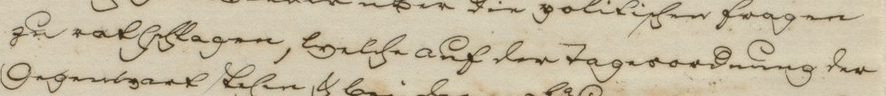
zu rathschlagen, welche auf der Tagesordnung der
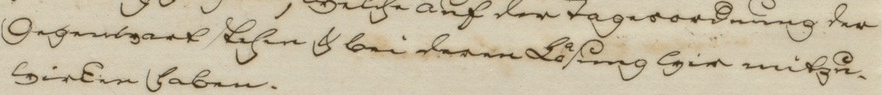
Gegenwart stehen & bei deren Lösung wir mitzu-
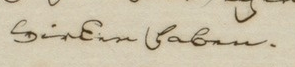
wirken haben.
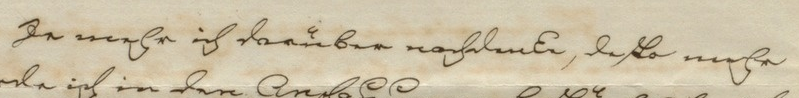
Je mehr ich darüber nachdenke, desto mehr
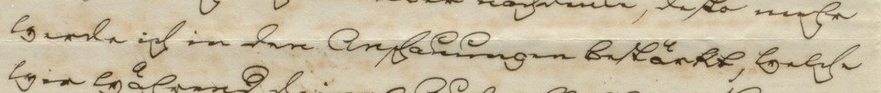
werde ich in den Anschauungen bestärkt, welche
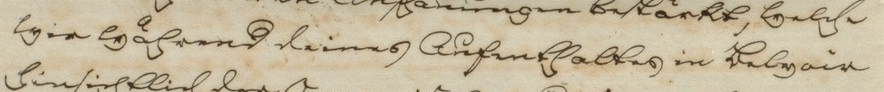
wir während Deines Aufenthaltes in Belvoir
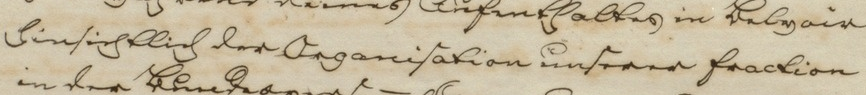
hinsichtlich der Organisation unserer Fraction
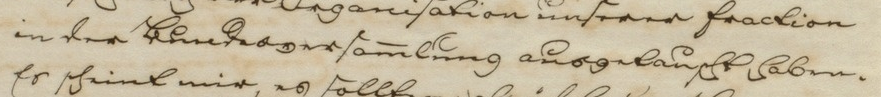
in der Bundesversammlung ausgetauscht haben.
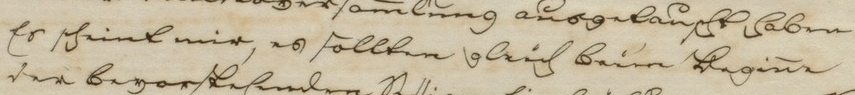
Es scheint mir, es sollten gleich beim Beginne
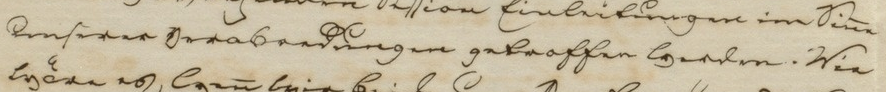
unserer Verabredungen getroffen werden. Wie
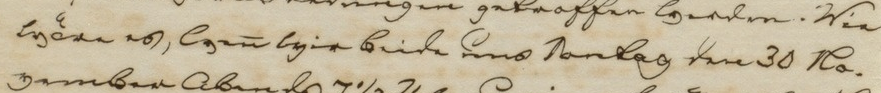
wäre es, wenn wir beide uns Sontag den 30. No-
